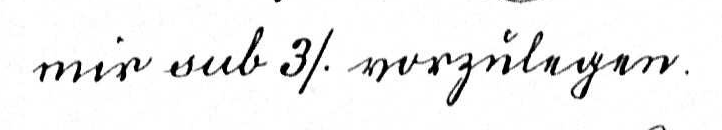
mir sub 3) vorzulegen.
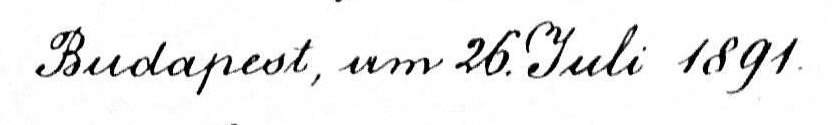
Budapest, am 26. Juli 1891
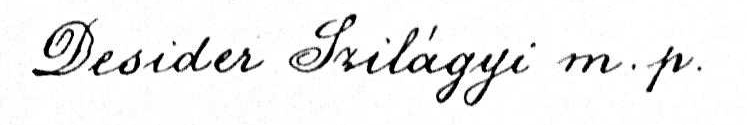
Desider Szilágyi m.p.
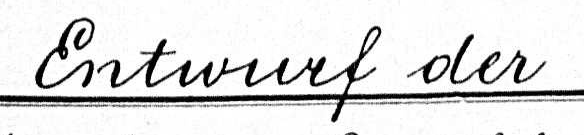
Entwurf der
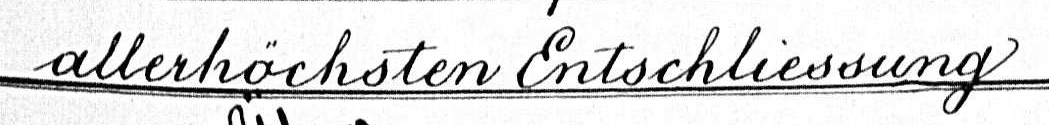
allerhöchsten Entschliessung
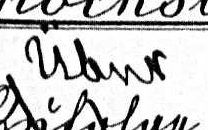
Über
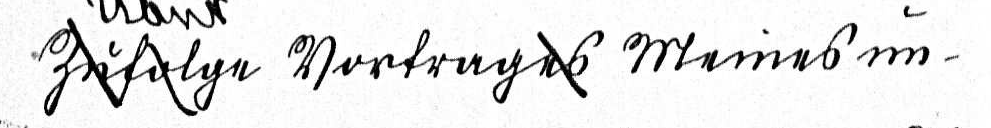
Vortrag Meines un¬
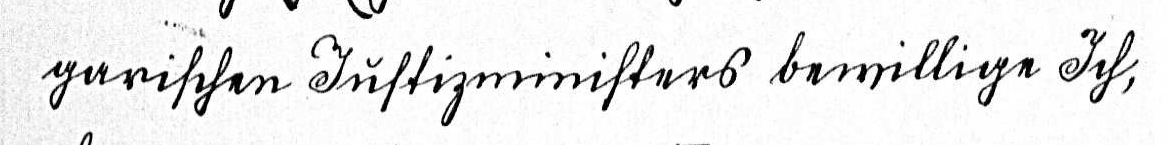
garischen Justizministers bewillige Ich,
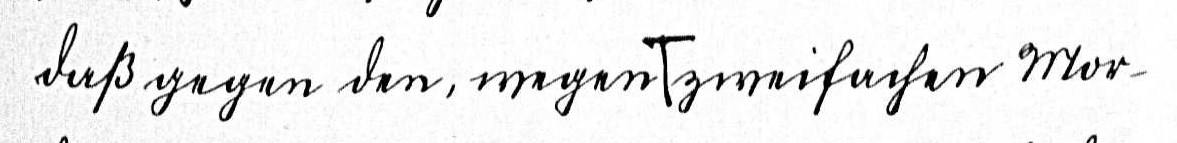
daß gegen den, wegen zweifachen Mor¬
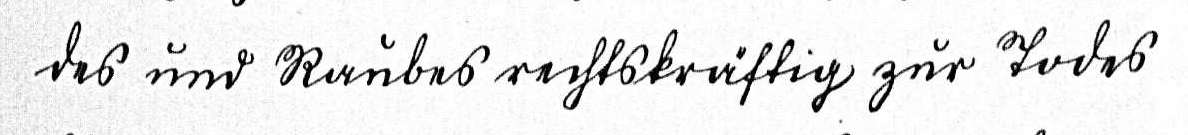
des und Raubes rechtskräftig zur Todes¬
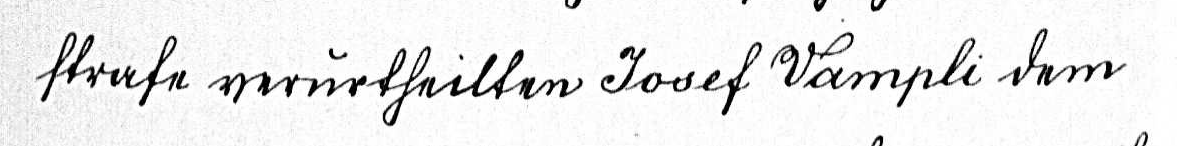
strafe verurtheilten Josef Vampli dem
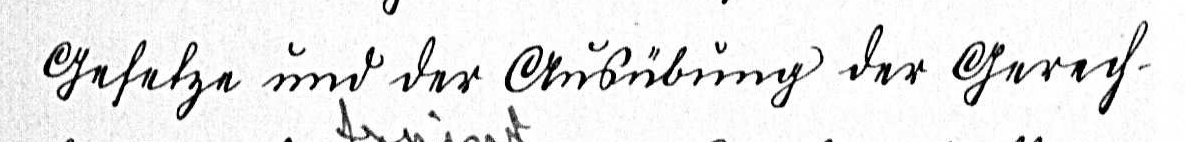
Gesetze und der Ausübung der Gerech¬
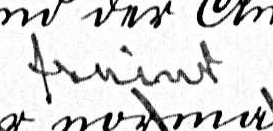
Freier
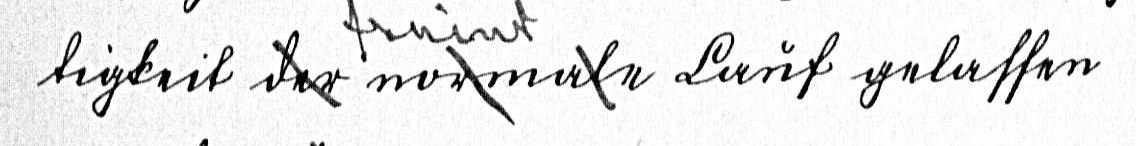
tigkeit Lauf gelassen
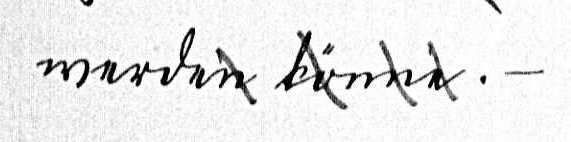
werde.
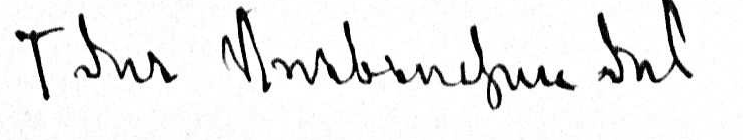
der Verbrechen des
